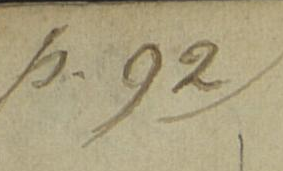p. 92
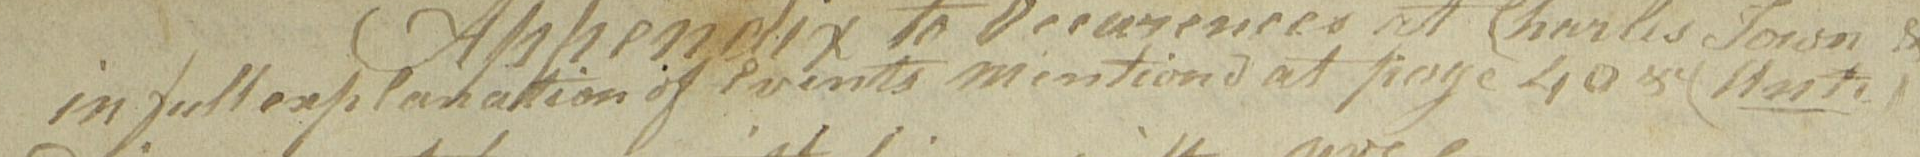in full explanation of Events mentiond at page 40 &^c (Ante)
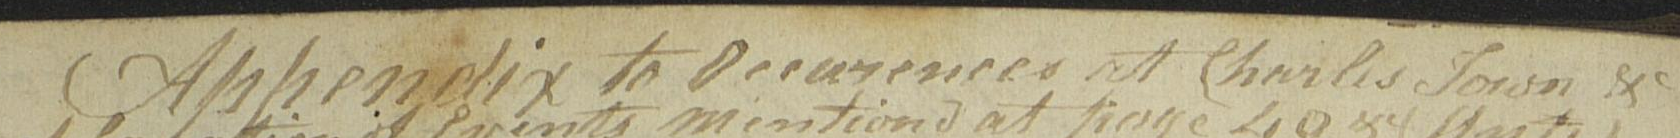Appendix to Occurences at Charles Town &^c
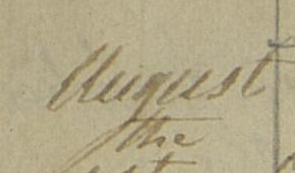August
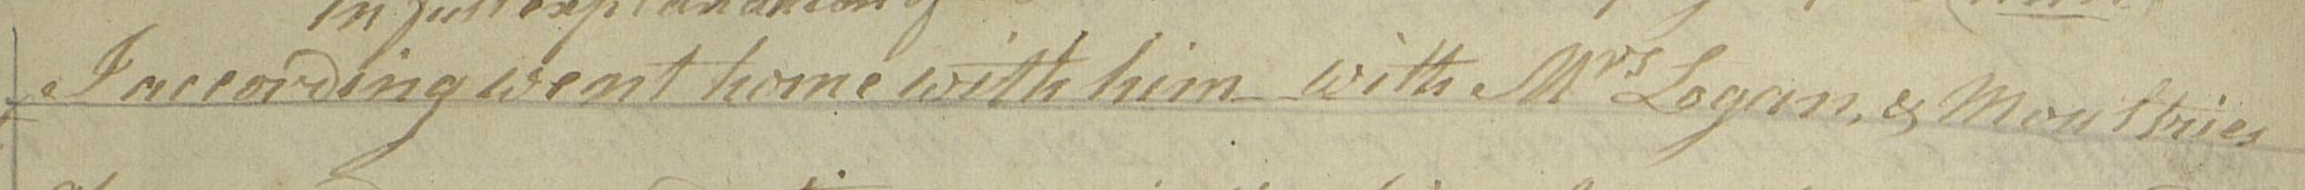I according went home with him with M^rs. Logan & Moustries
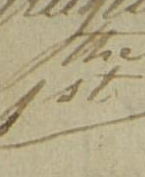1^st
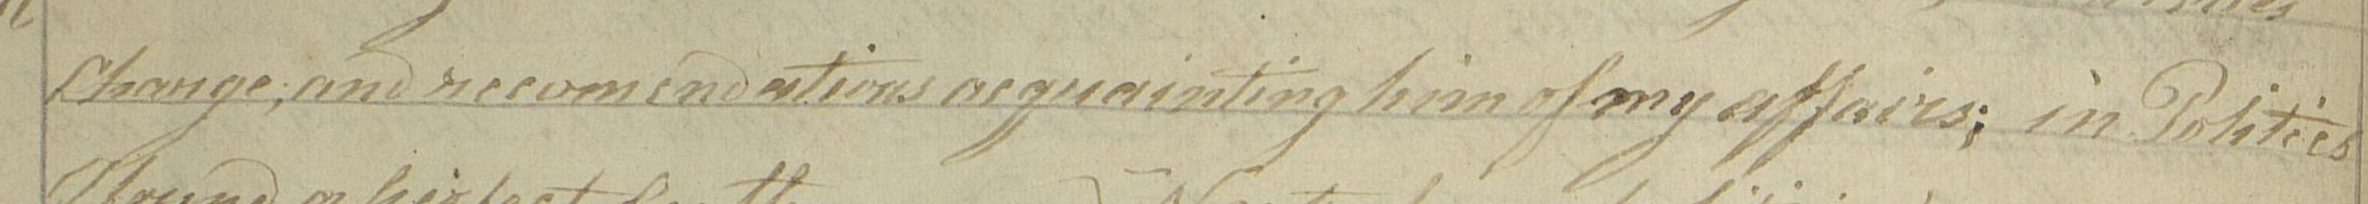change, and recomendations acquainting him of my affairs; in Politics
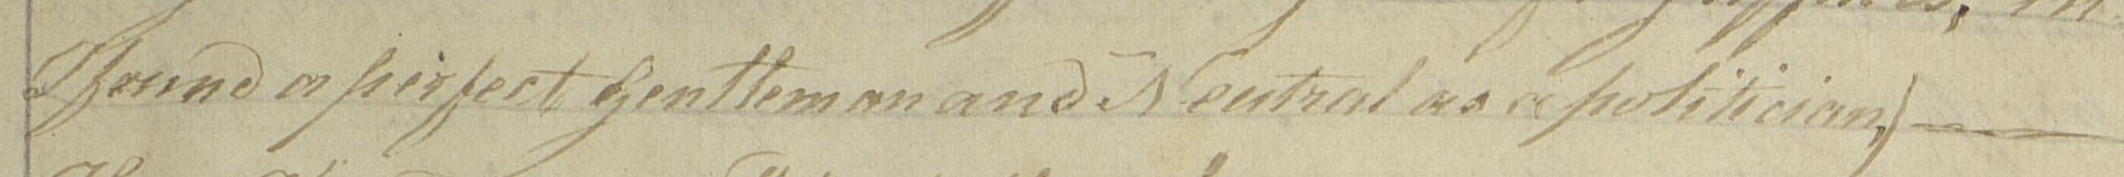found a perfect Gentleman and Neutral as a politician,)
